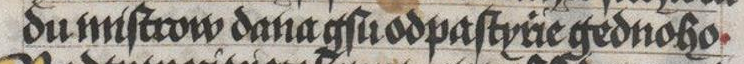du míſtrow dana gſu odpaſtyṙie gednoho.
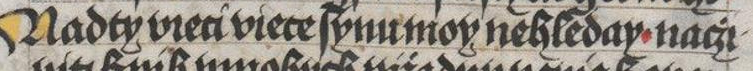Nadty vieci viece ſynumoy nehleday.nacżi¬
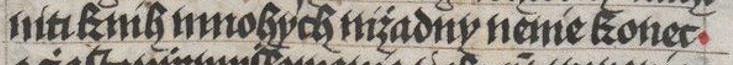niti kníh mnohych niżadny neníe konec.
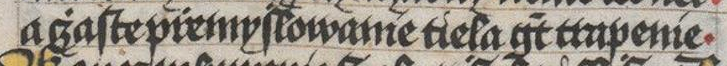a cżaſte pṙemyẛlowaníe tiela ḡt trapeníe
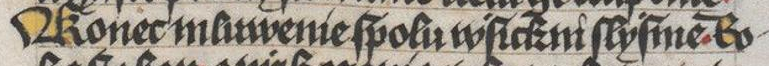Konec mluweníe ſpolu wẛickni ſlyẛme.Bo¬
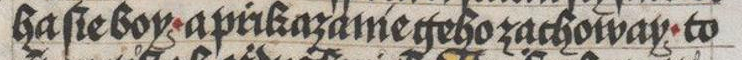ha ſie boy.a pṙikazaníe geho zachoway.to
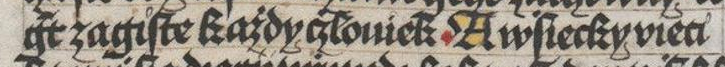ḡt zagiſte każdy cżlouiek. A wẛiecky vieci
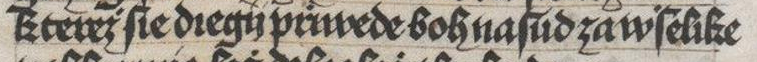ktereż ſíe diegíj pṙiwede boh na ſúd za wẛelike
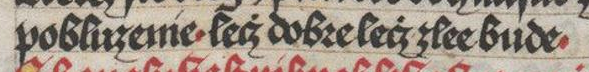pobluzeníe.lecż dobre lecż zlee bude.
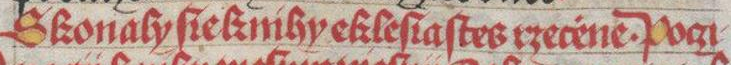Skonaly ẛie knihy ekleſiaſtes rzeċene. Poczi¬
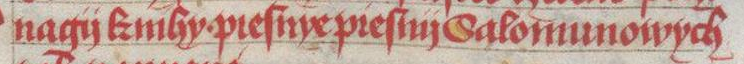nagij kníhy.pieſnye píeſníj Salomunowych
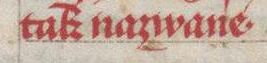tak nazwané.
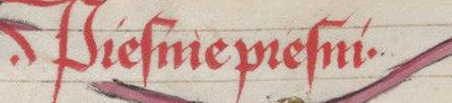Pieſnie pieſní
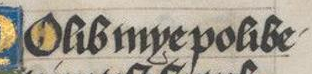Olib mye polibe¬
